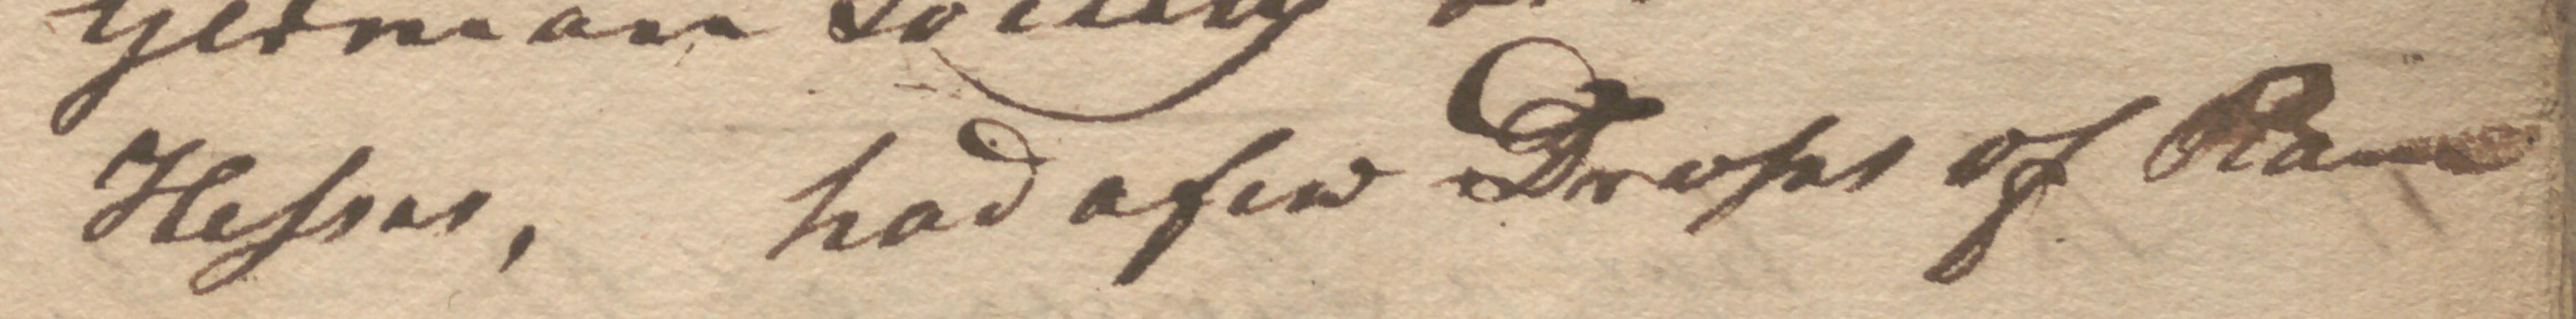Hesses, had a few Drops of Rain
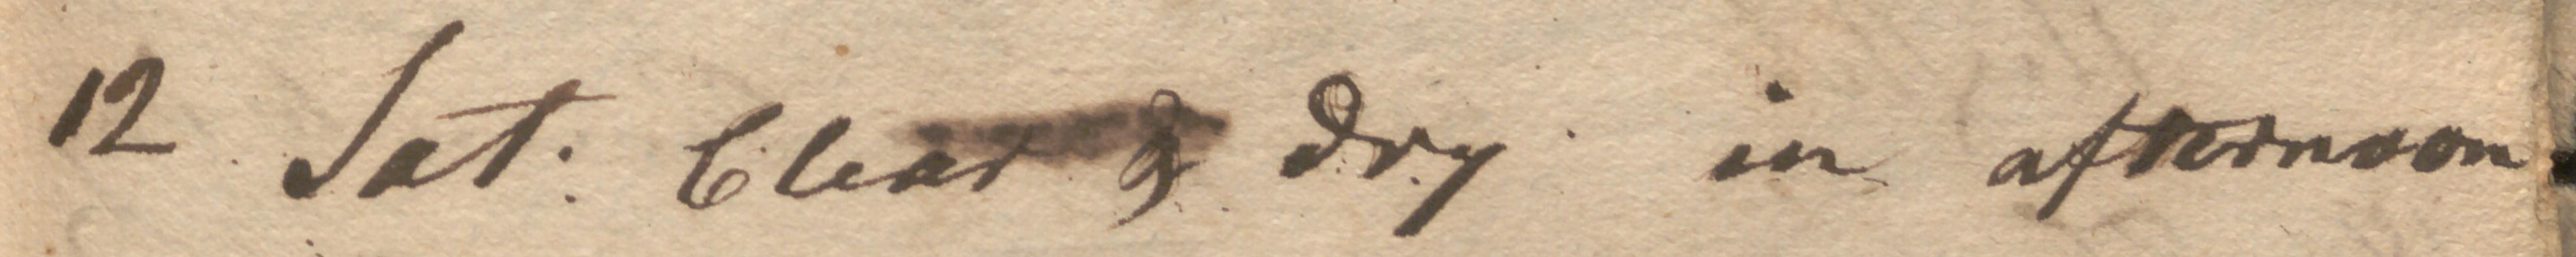12 Sat: Clear & dry. in afternoon
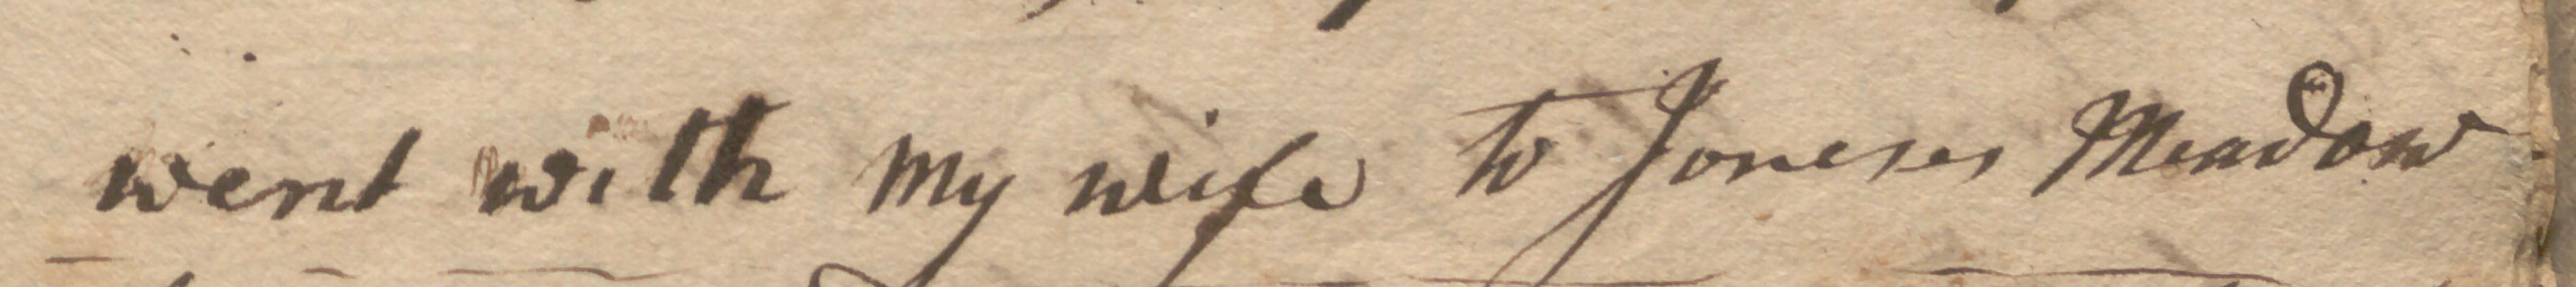went with my wife to Joneses Meadow
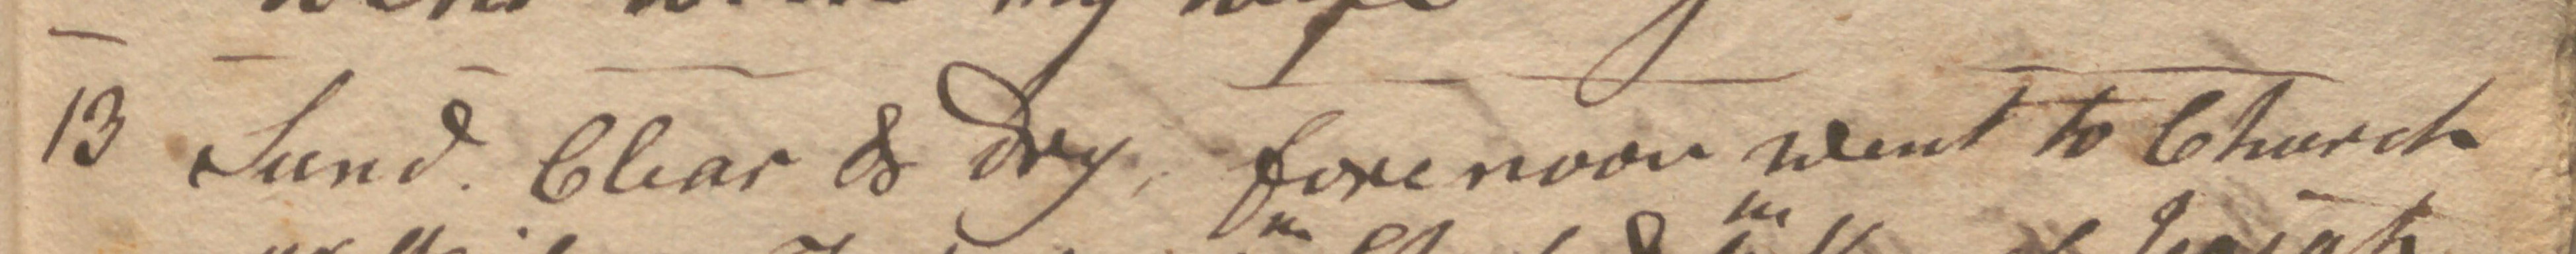13 Sund. Clear & dry, forenoon went to Church
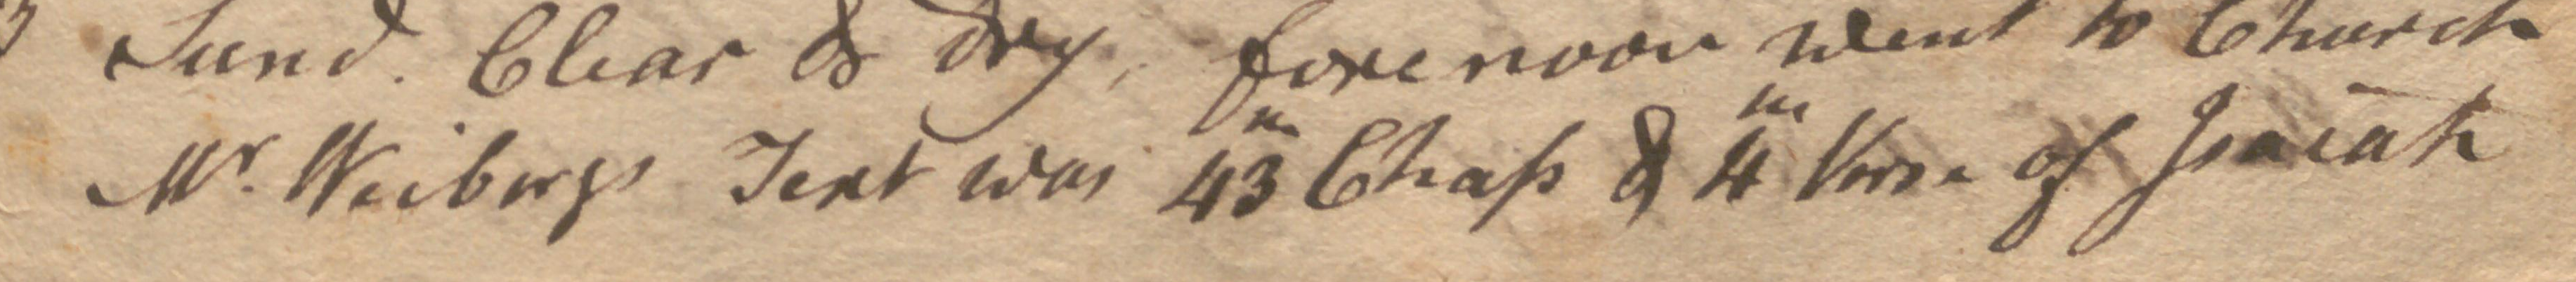M^r. Weibergs Text was 43^th Chap & 4^^th Verse of Isaiah
